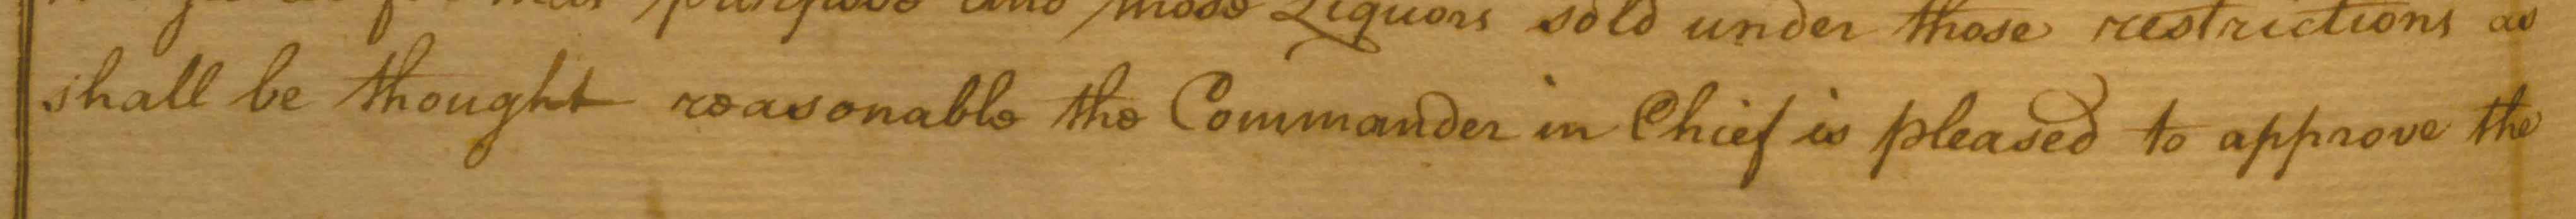shall be thought reasonable the Commander in Chief is pleased to approve the
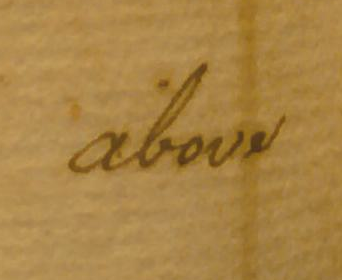above
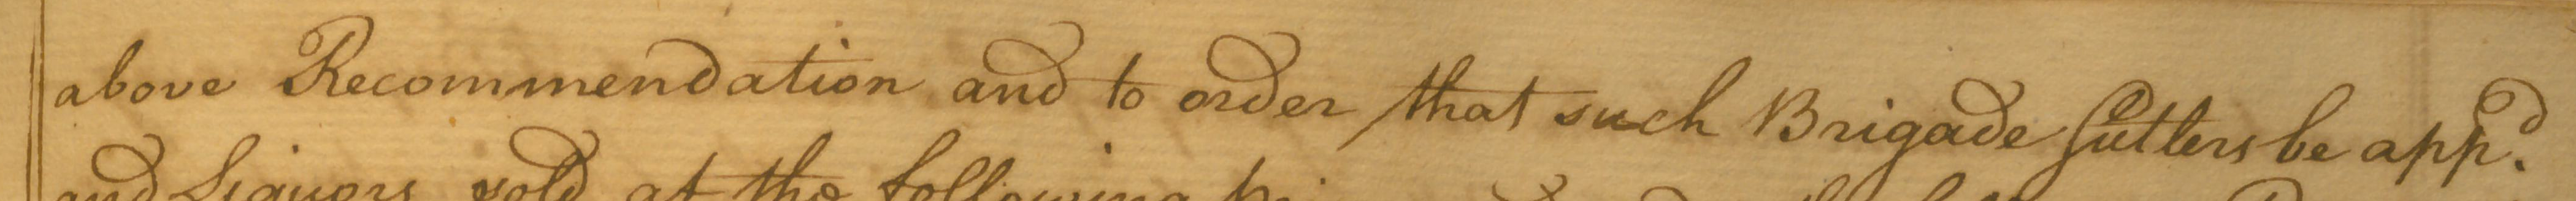above Recommendation and to order that such Brigade sutlers be app^d.
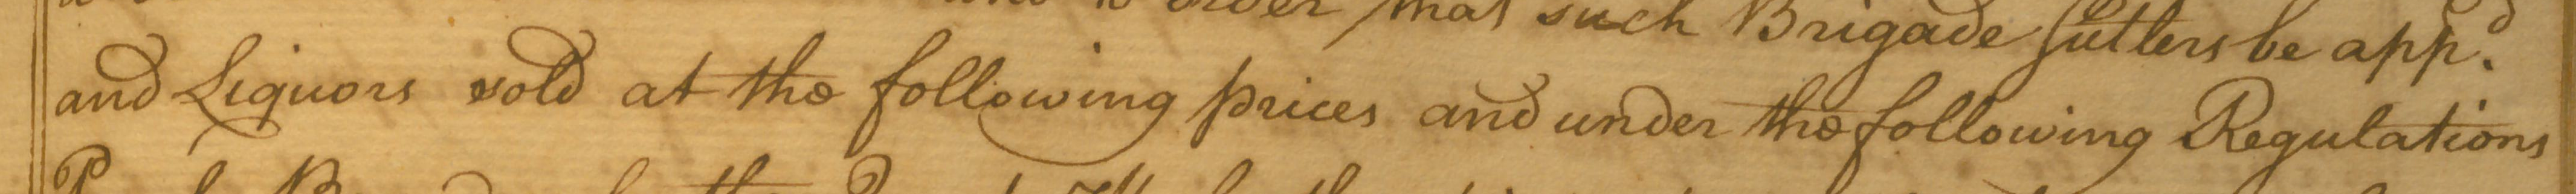and Liquors sold at the following prices and under the following Regulations
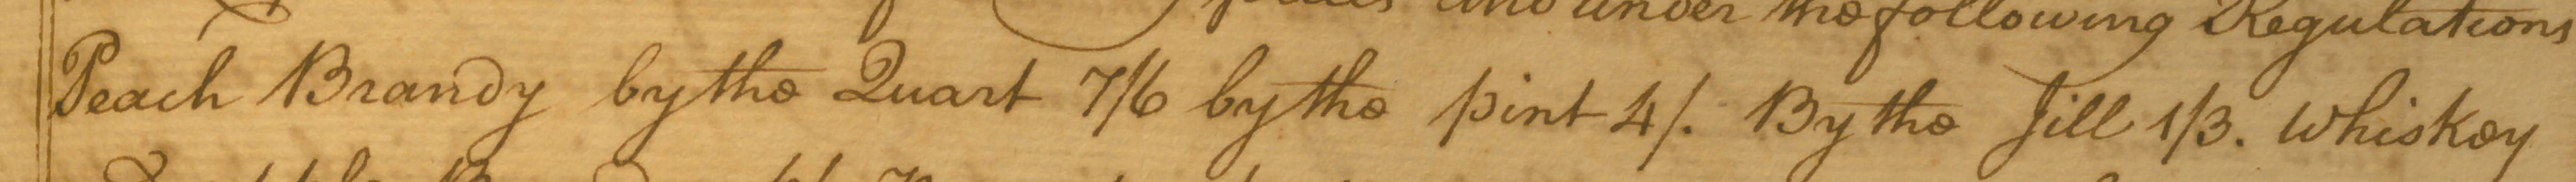Peach Brandy by the Quart 7s6 by the pint 4s. By the Jill 1s3. Whiskey
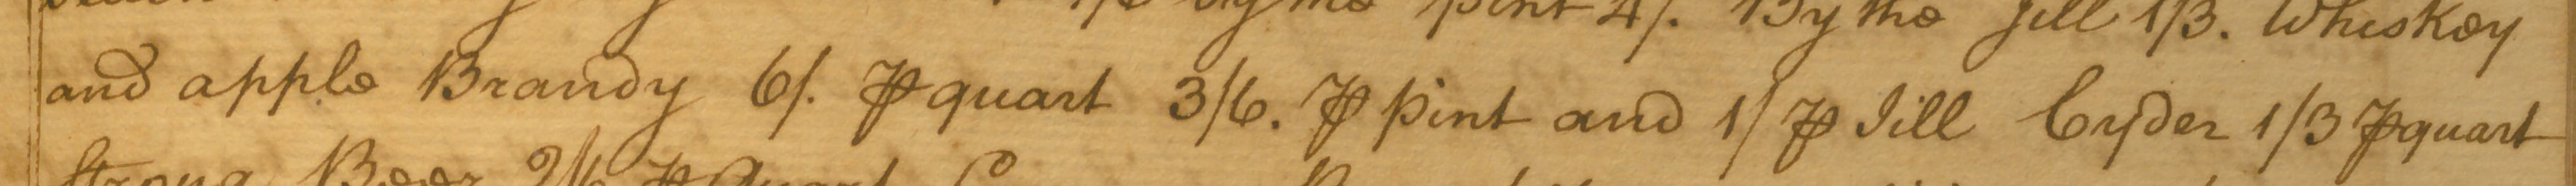and apple Brandy 6s. per quart 3s6. per pint and 1s per Jill Cyder 1s3 per quart
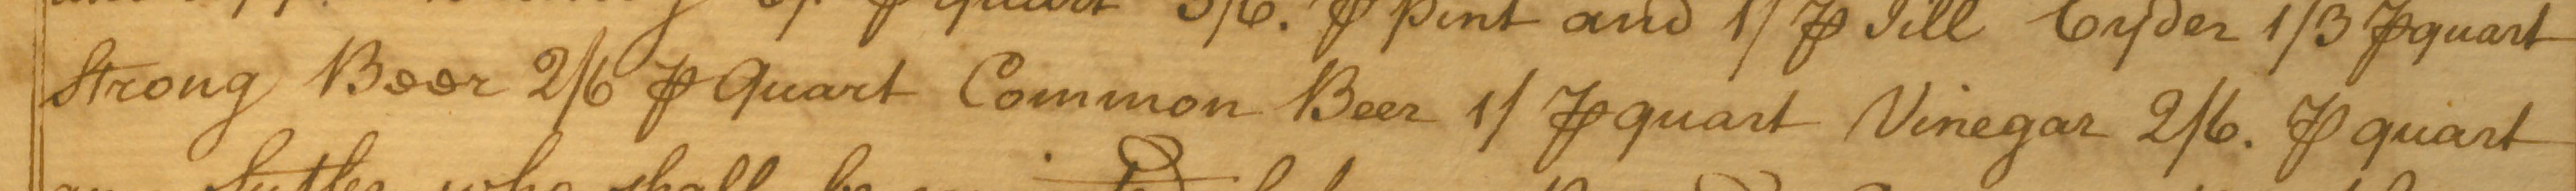Strong Beer 2s6 per quart Common Beer 1s per quart Vinegar 2s6 per quart
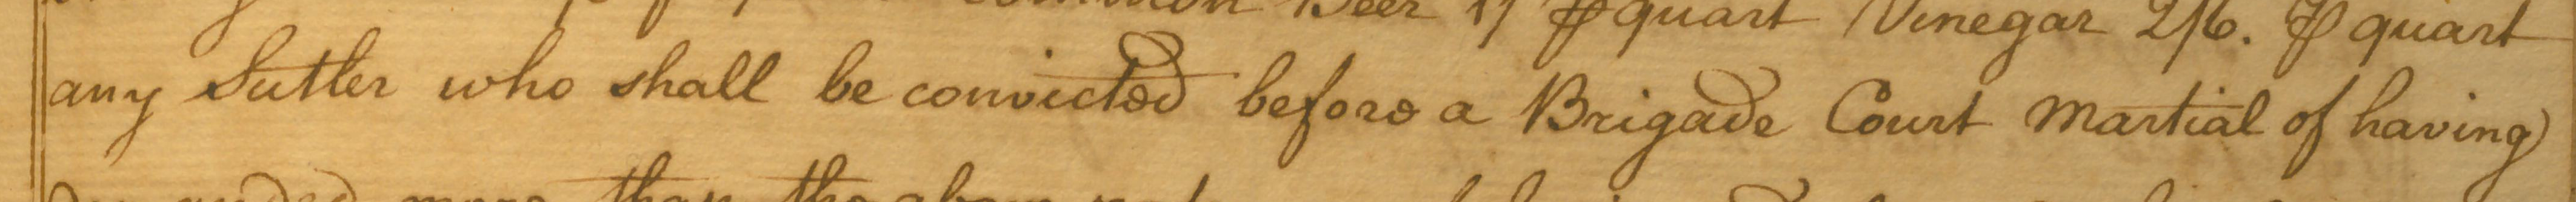any Sutler who shall be convicted before a Brigade Court Martial of having
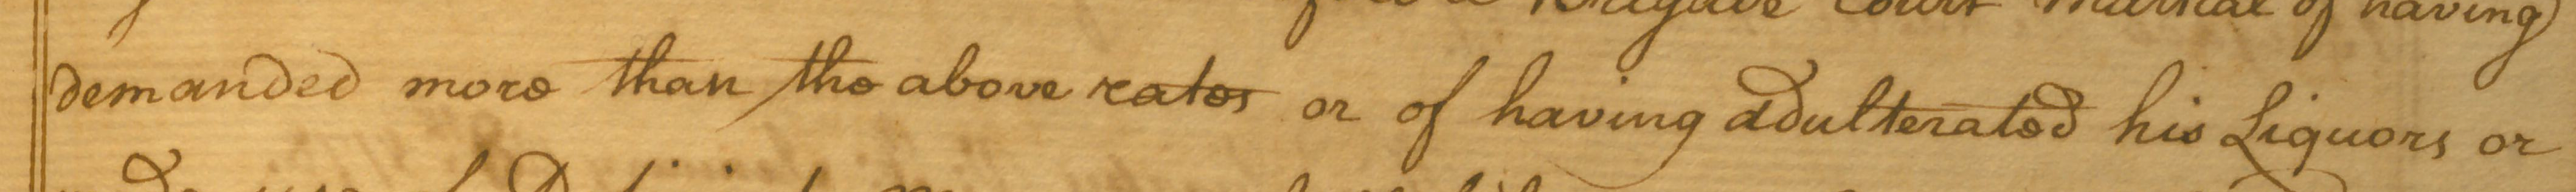demanded more than the above rates or of having adulterated his Liquors or
